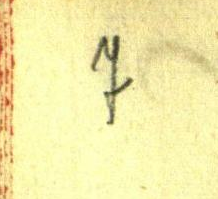7
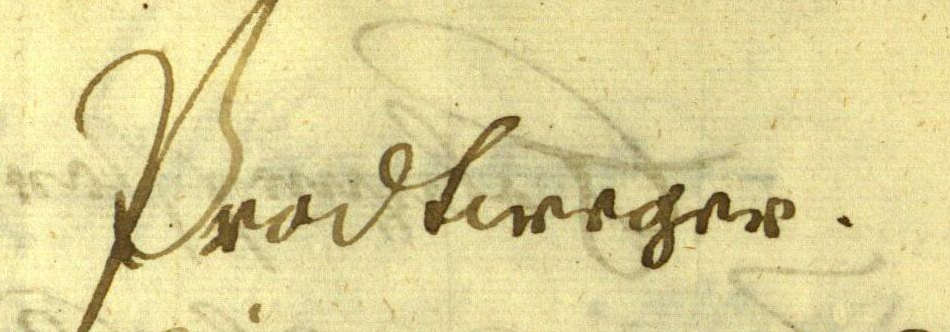Prodtweger.
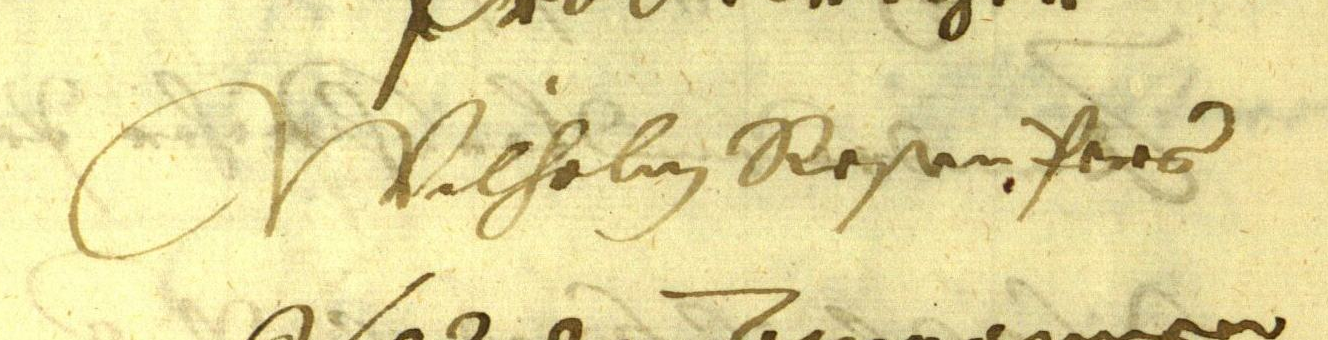Wilhelm Resen Perg
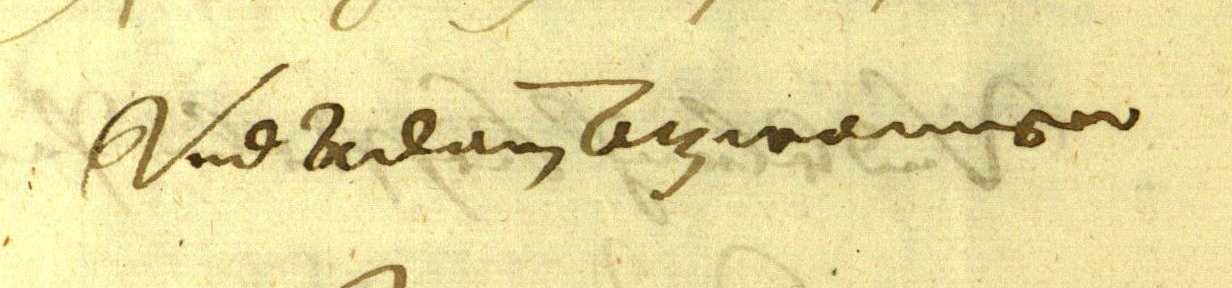Vnd Adam Azwannger
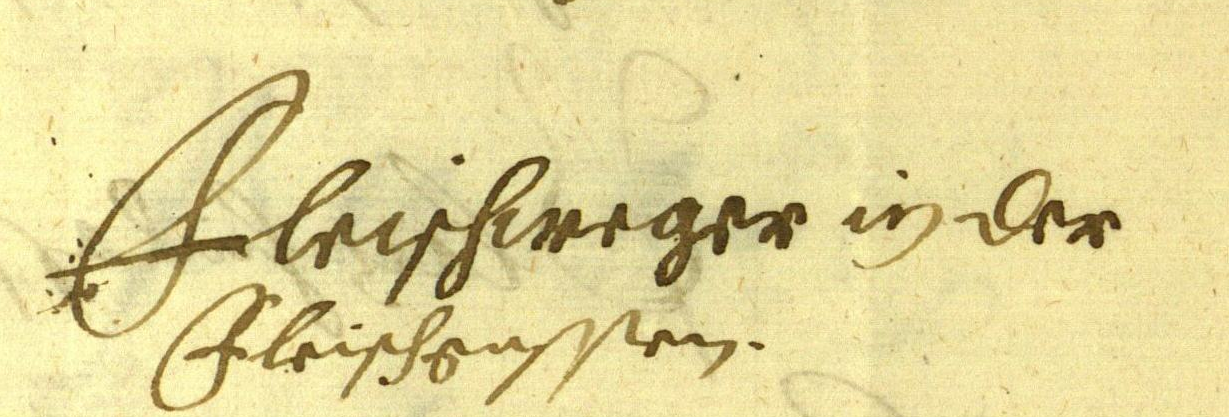Fleischweger in der
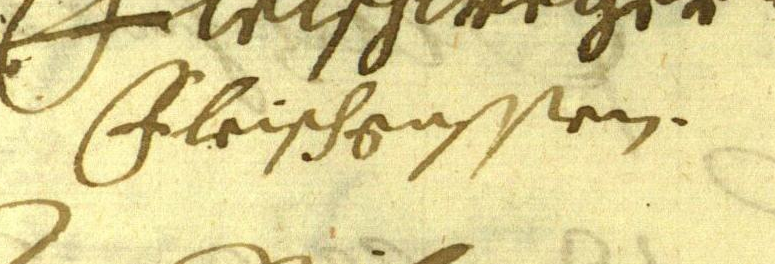Fleischgassen.
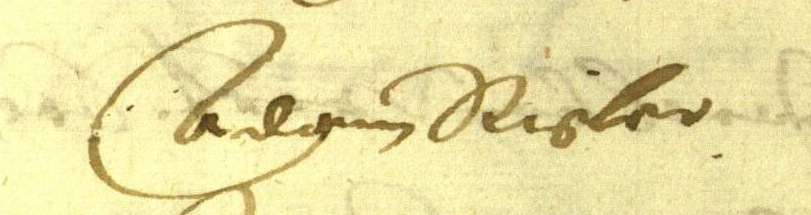Adam Rigler
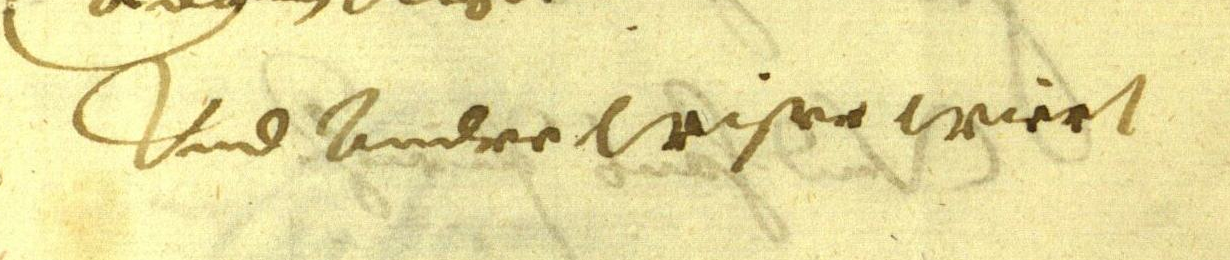Vnd Andre Wiser Wiert
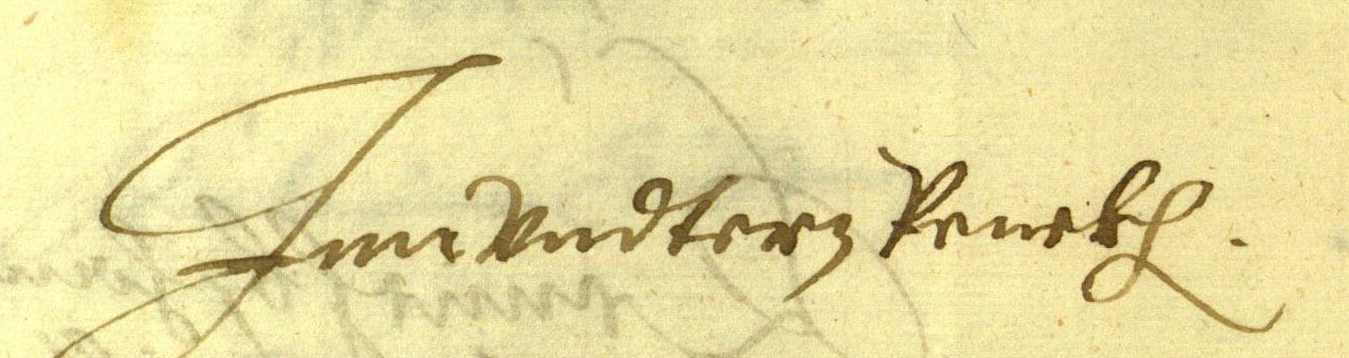Inn Vndtern Penckh.
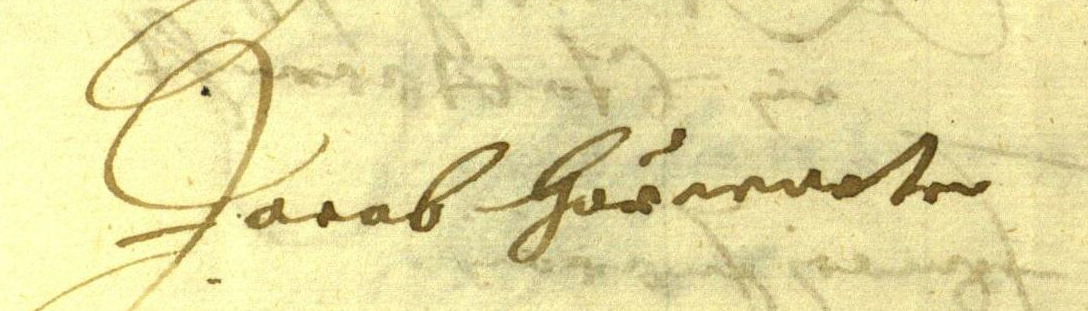Jacob Hōrwarter
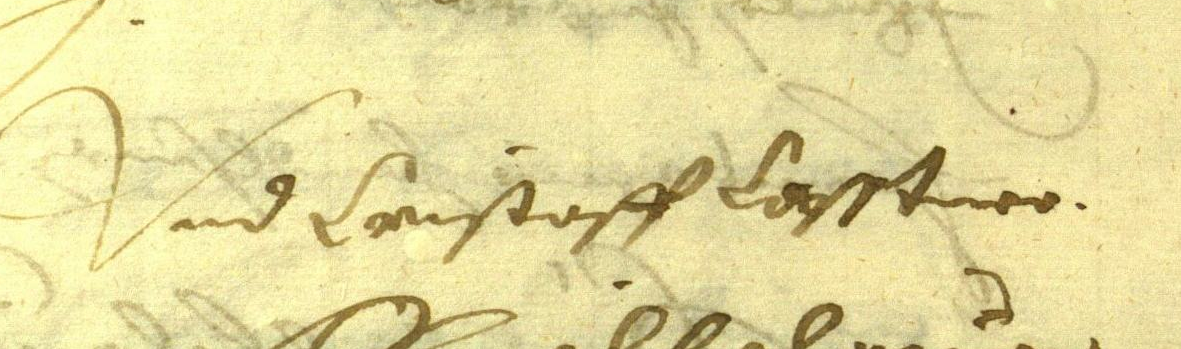Vnd Cristoff Casstner.
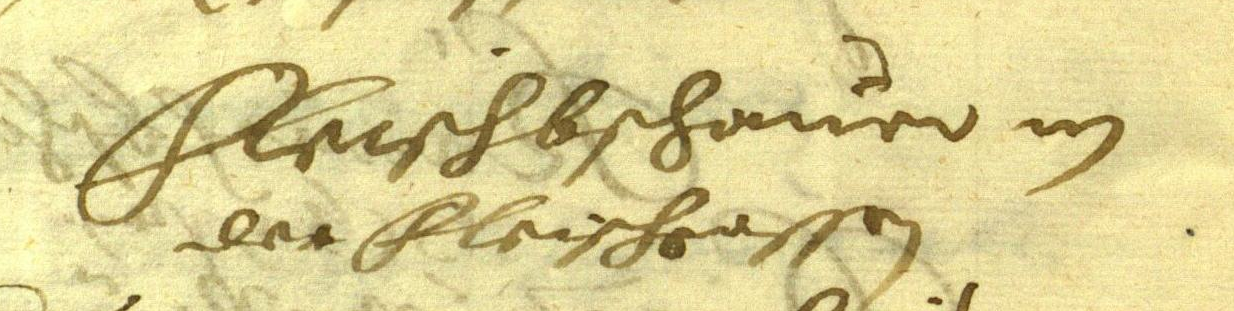Fleischbschaūer in
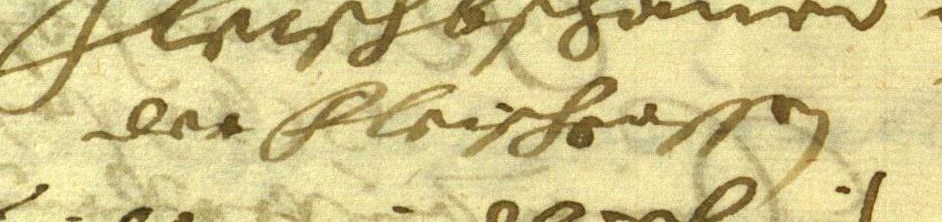der Fleischgassen
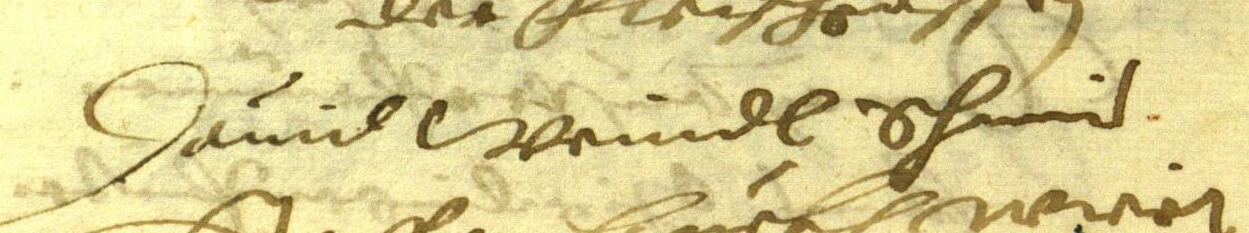Dāvid Weindl Schmid.
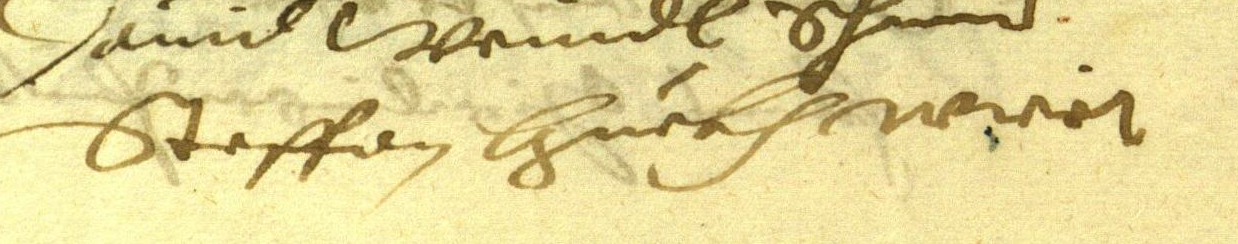Steffan Hūckh Wiert
